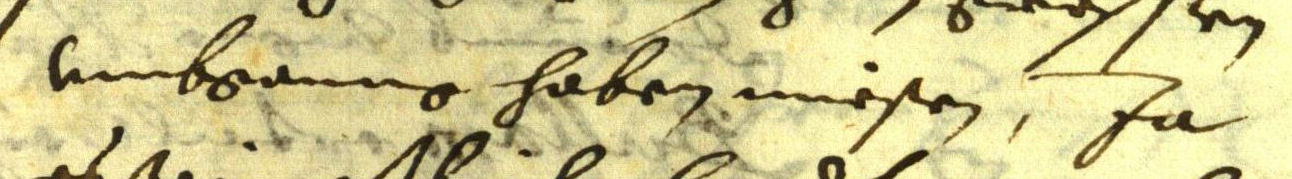vmbganng haben miesen, Ja
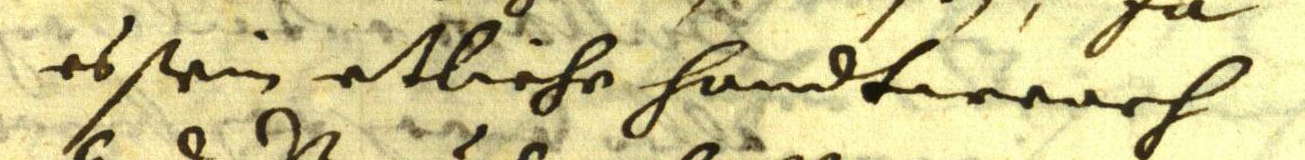Es sein etliche Handtwerch
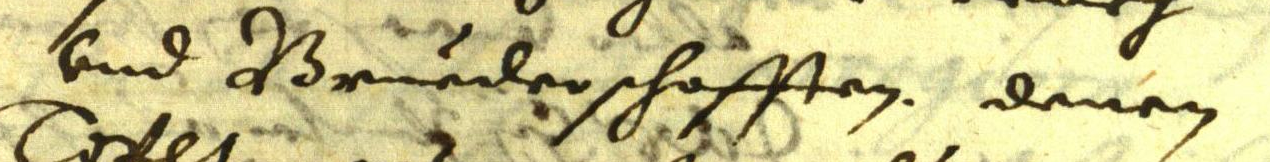vnd Brūederschafften. denen
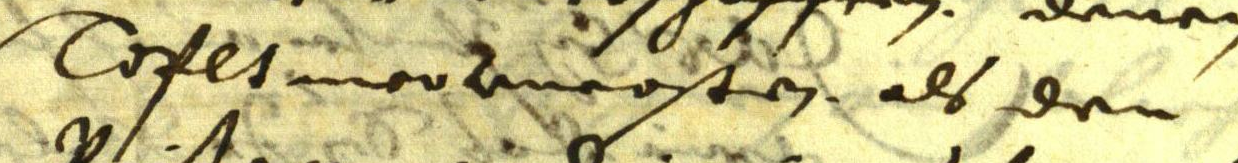ToPlt mer vncosten. als den
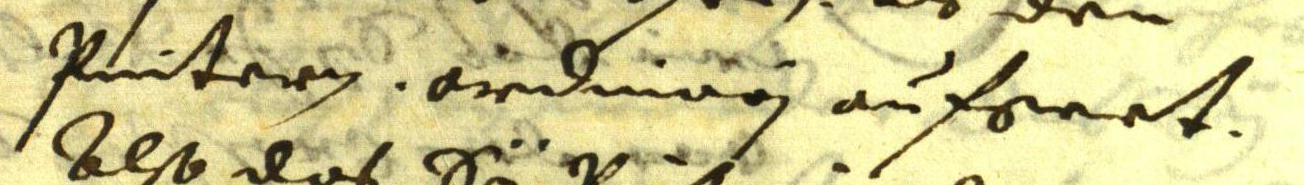Pintern. ordinarj aūfgeet.
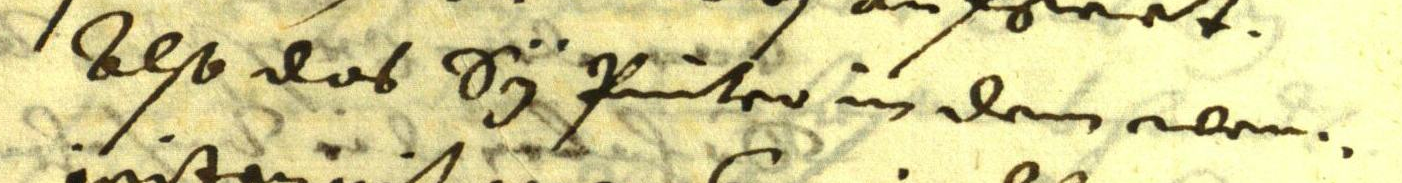Also das Sÿ Pinter in dem wen¬
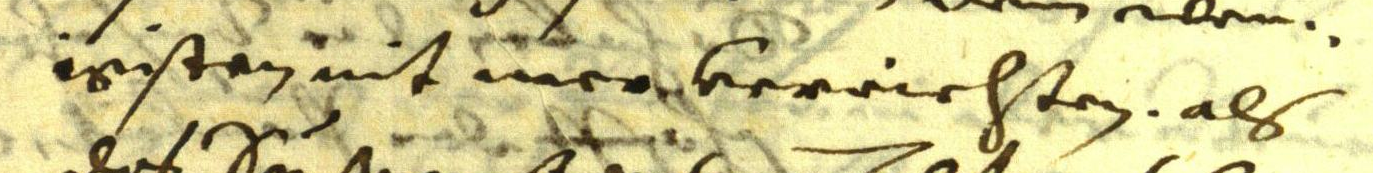igisten nit mer verrichten. als
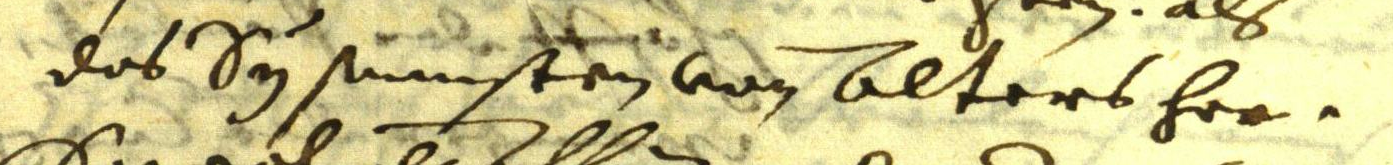das Sȳ sonnsten von Alters her
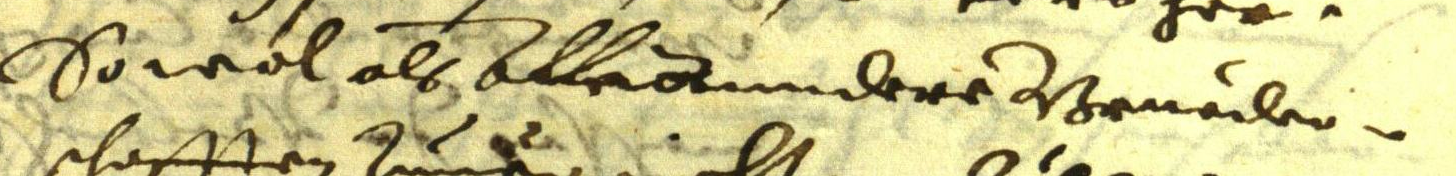So wol als Alle Anndere Brūeder¬
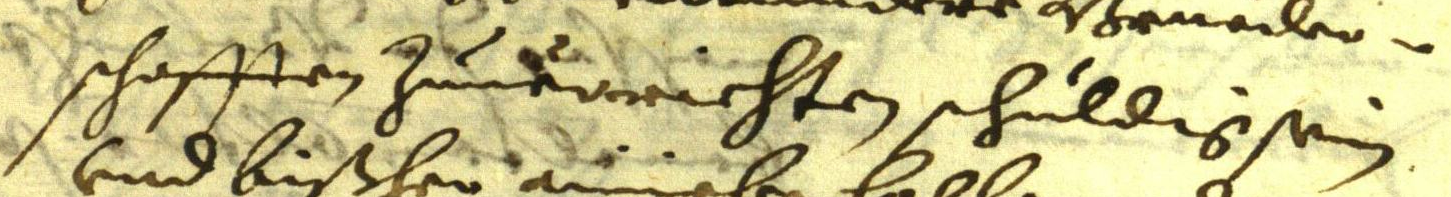schafften Zūūrichten schūldig sein
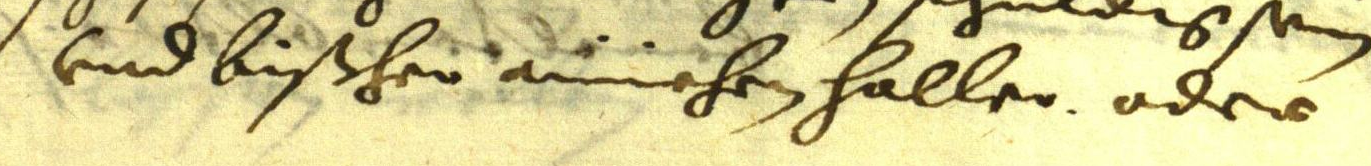vnd bißher ainichen haller. oder
